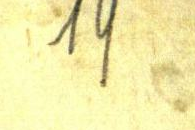19
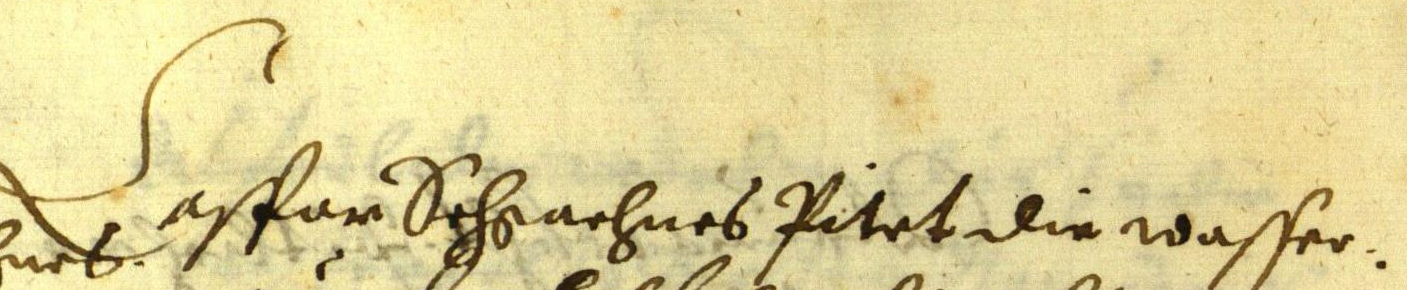Caspar Schgrafers Pitet die wasser¬
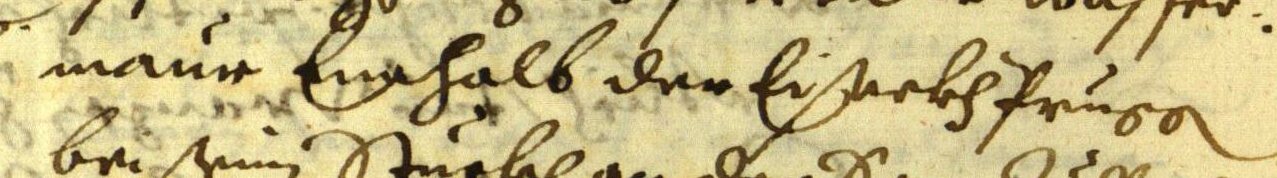maūr Ennhalb der Eisackh Prūgg
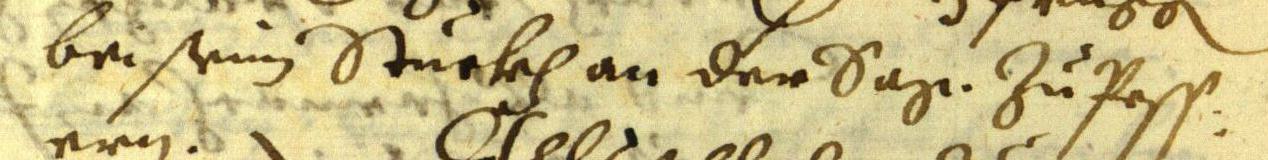bei seim Stūckh an der Sag. Zū Pess¬
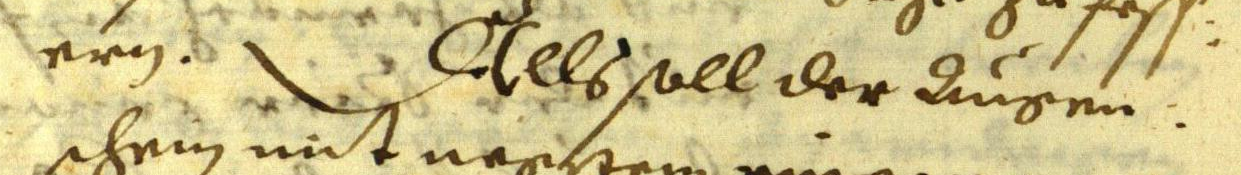ern. Alls soll der Aūgen¬
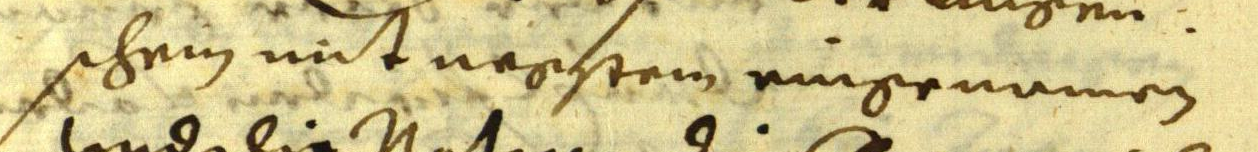schein mit negstem eingenomen
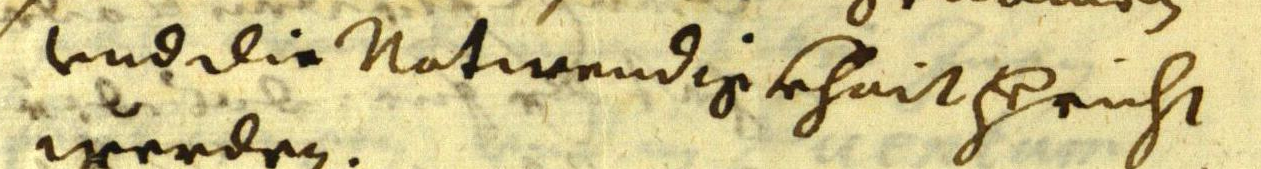vnd die Notwendigkhait vricht
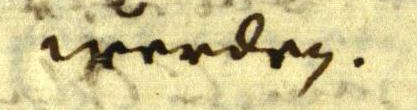werden.
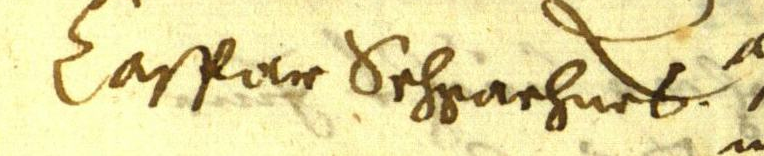Caspar Schgrafers.
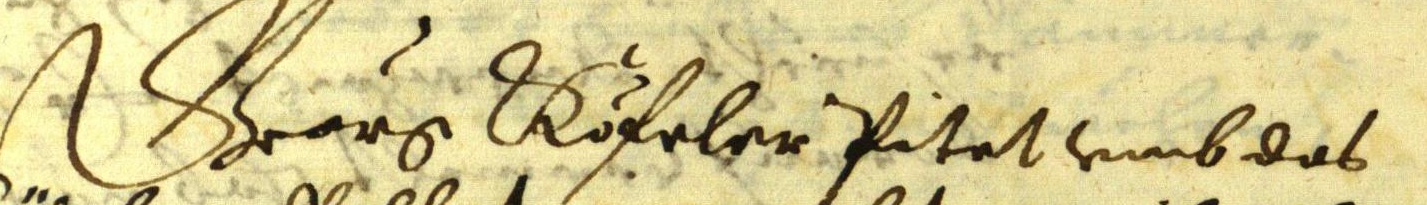Geōrg Kōfeler Pitet umb das
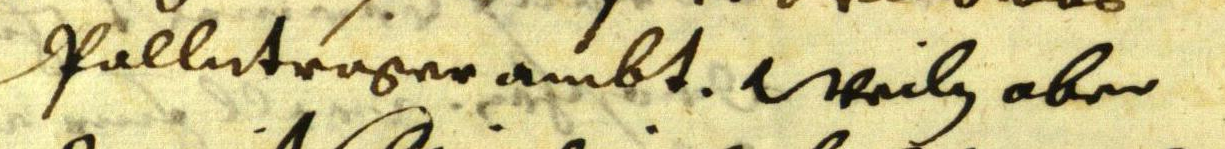Pallntrager ambt. Weiln aber
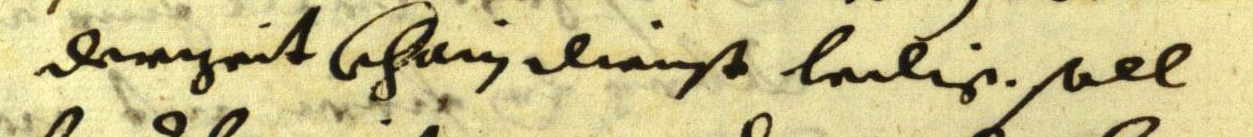derzeit khain dienst ledig. soll
